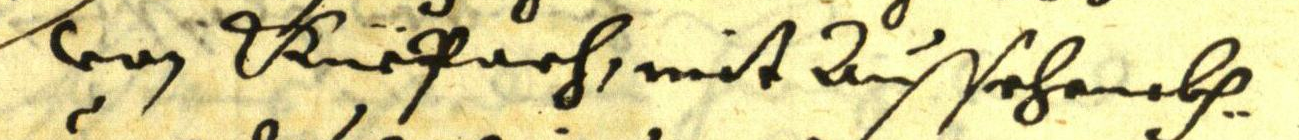von Küepach, mit Aūsschenckh¬
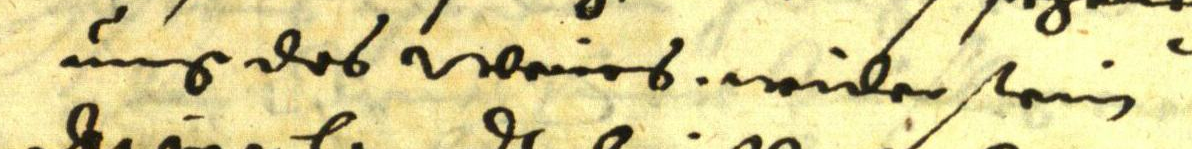ūng des Weins. wider sein
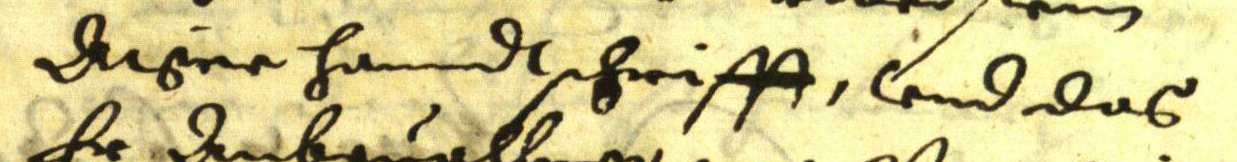Aigne Hanndtschrifft, vnd das
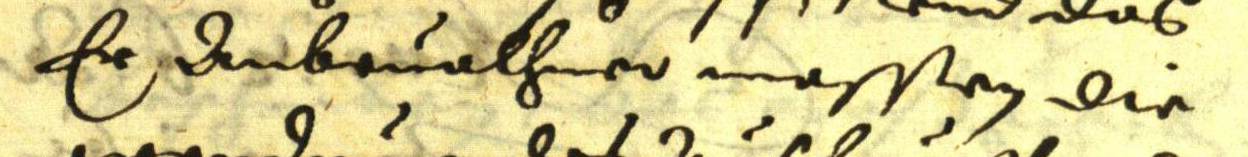Er Anbevolhner massen die
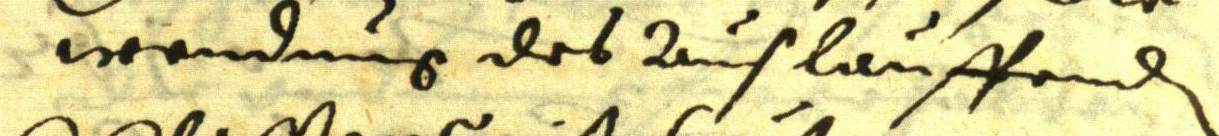wendūng des Aūslaūffend
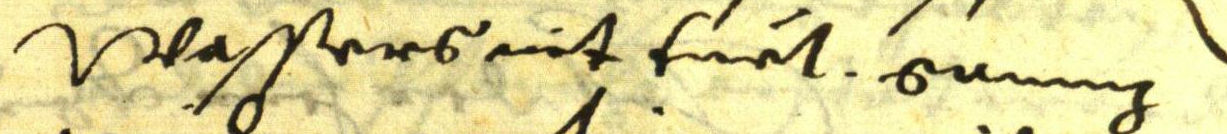Wassers nit tūet. gannz
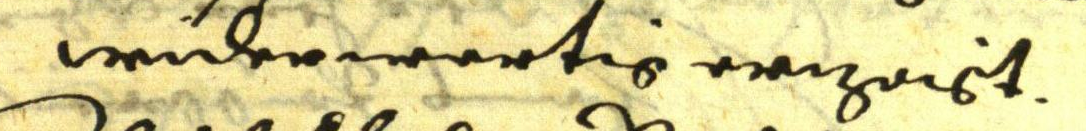widerwertig erzaigt.
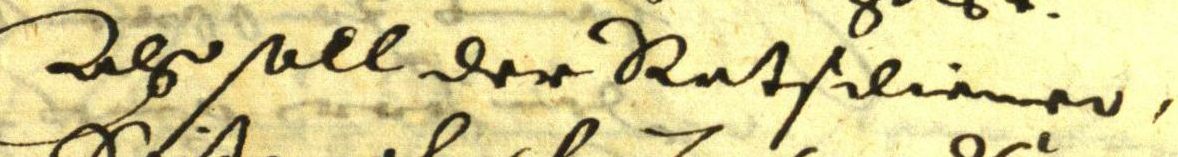Als soll der Ratsdiener,
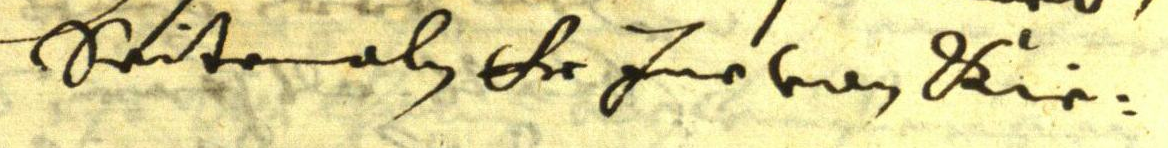Seitemaln Er Ine von Kie¬
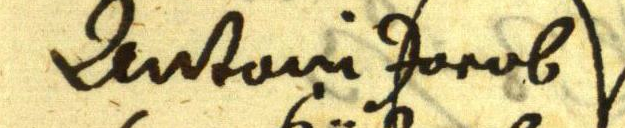Antoni Jacob
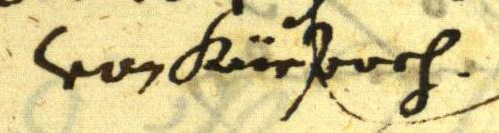von KüePach.
